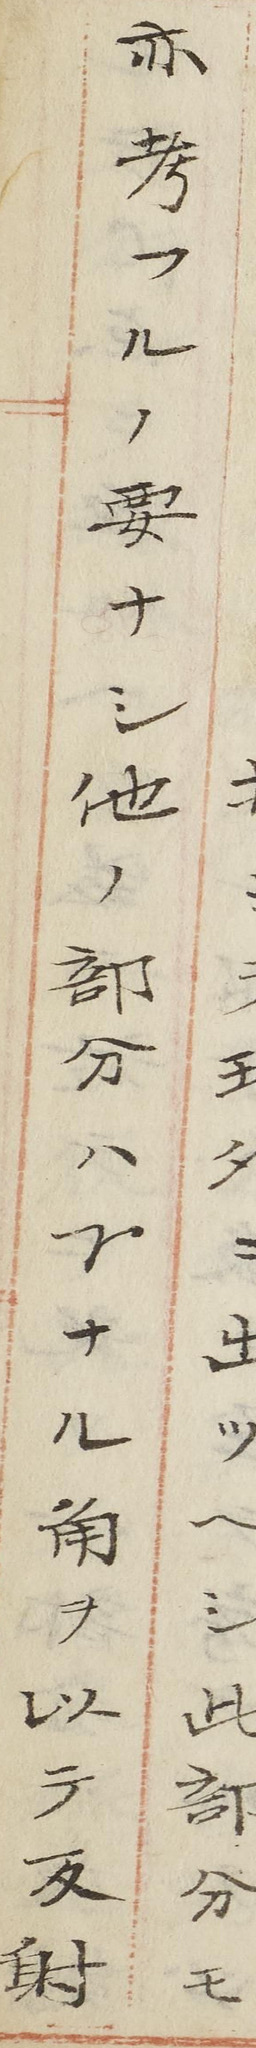亦考フルノ要ナシ他ノ部分ハｒナル角ヲ以テ反射

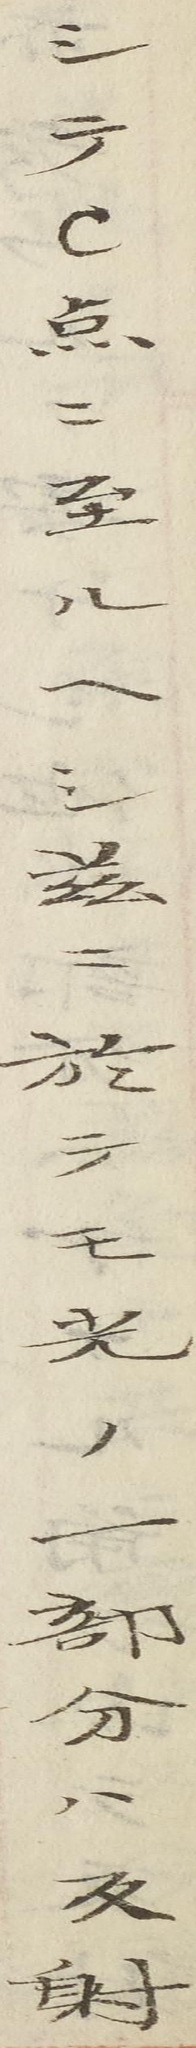シテｃ点ニ至ルヘシ茲ニ於テモ光ノ一部分ハ反射
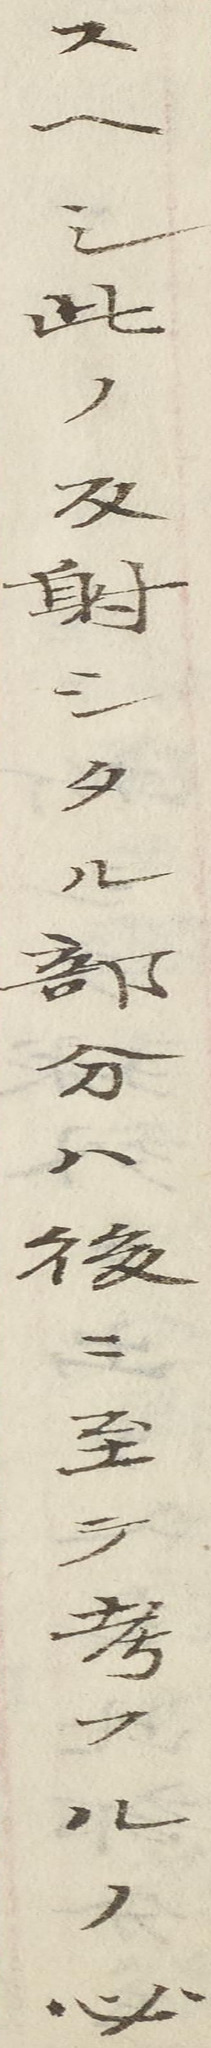スヘシ此ノ反射シタル部分ハ後ニ至テ考フルノ必
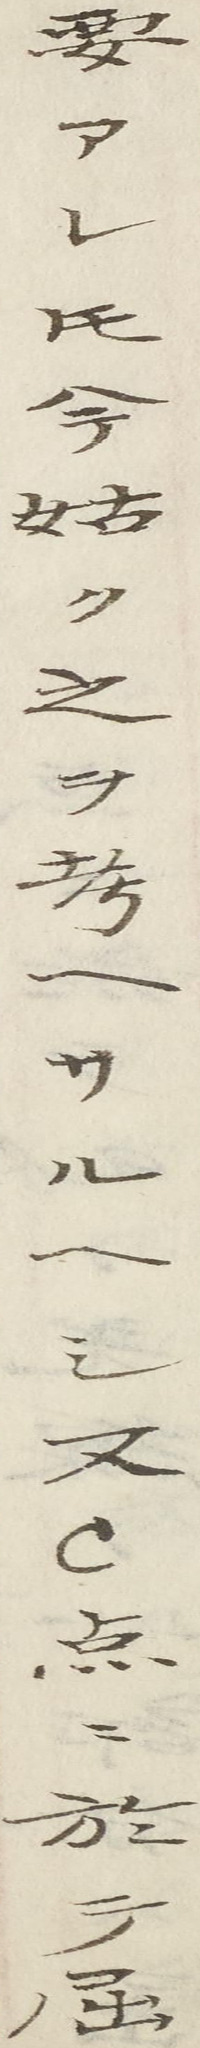要アレトモ今姑ク之ヲ考ヘサルヘシ又ｃ点ニ於テ屈
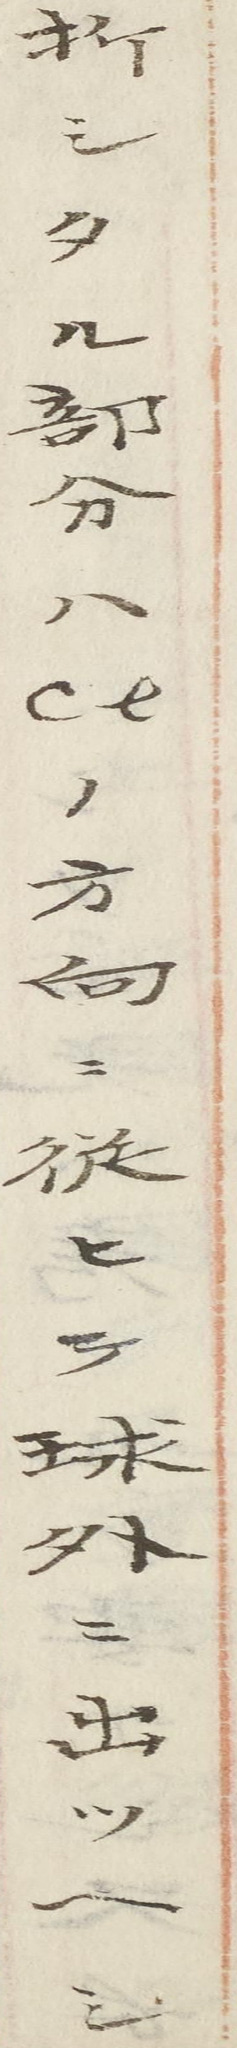折シタル部分ハｃｅノ方向ニ従ヒテ球外ニ出ツヘシ
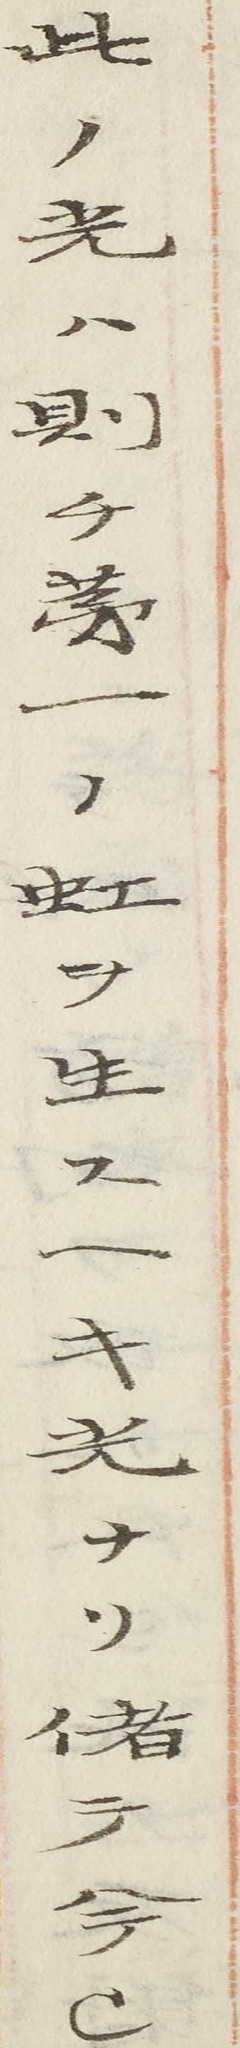此ノ光ハ則チ第一ノ虹ヲ生スヘキ光ナリ偖テ今ｃ
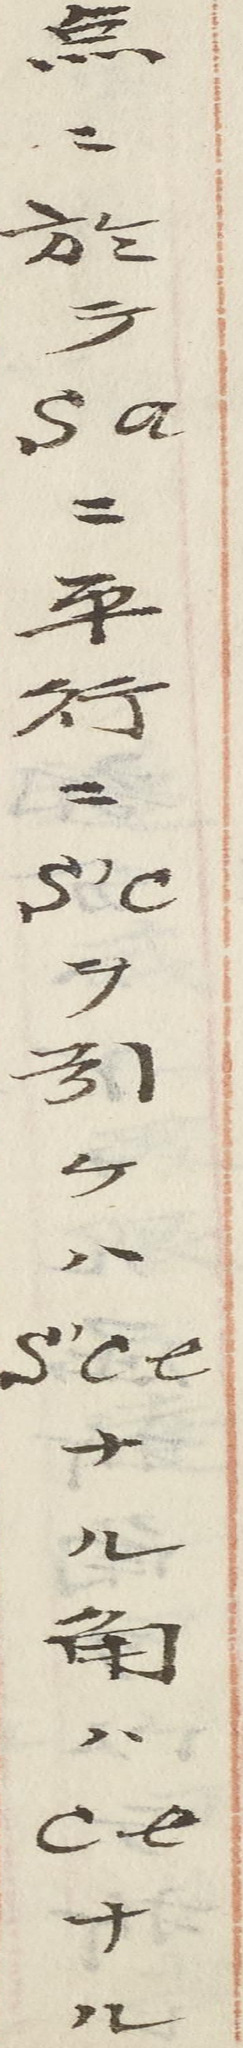点ニ於テａニ平行ニｃヲ引ケハｃｅナル角ハｃｅナル
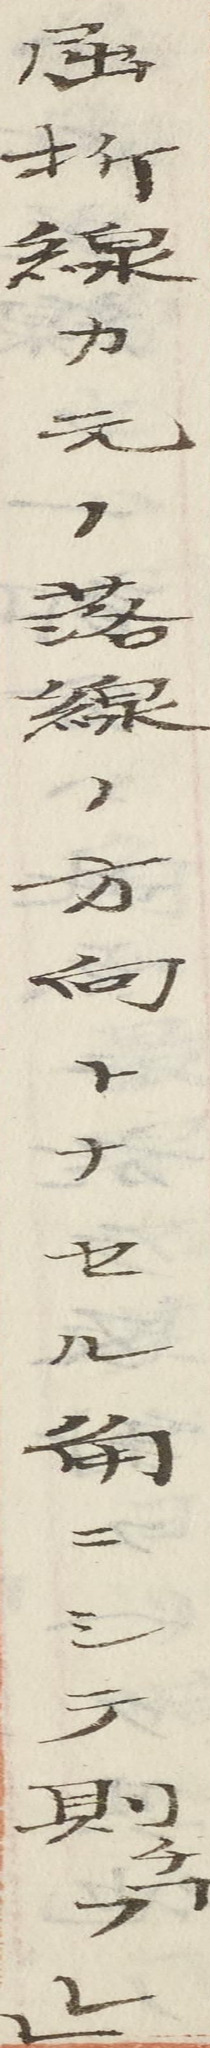屈曲線カ元ノ落線ノ方向トナセル角ニシテ則チ「フレ」
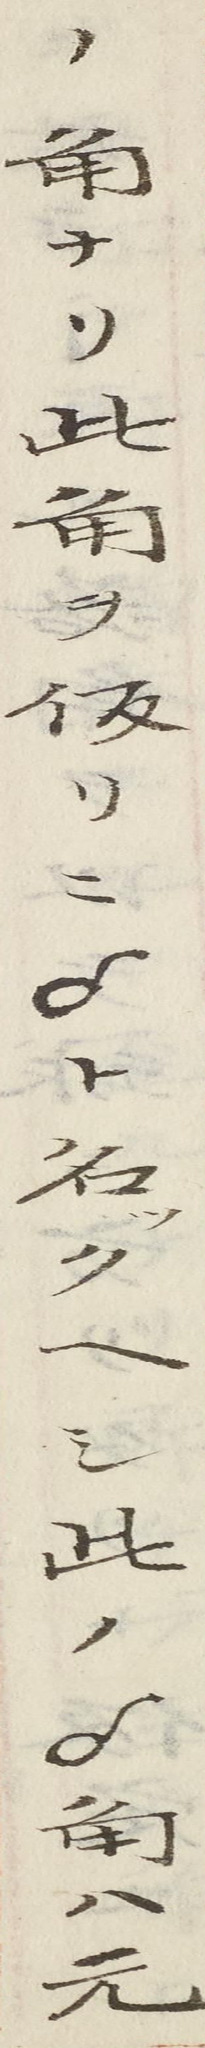ノ角ナリ此角ヲ仮リニｄト名ツクヘシ此ノｄ角ハ元
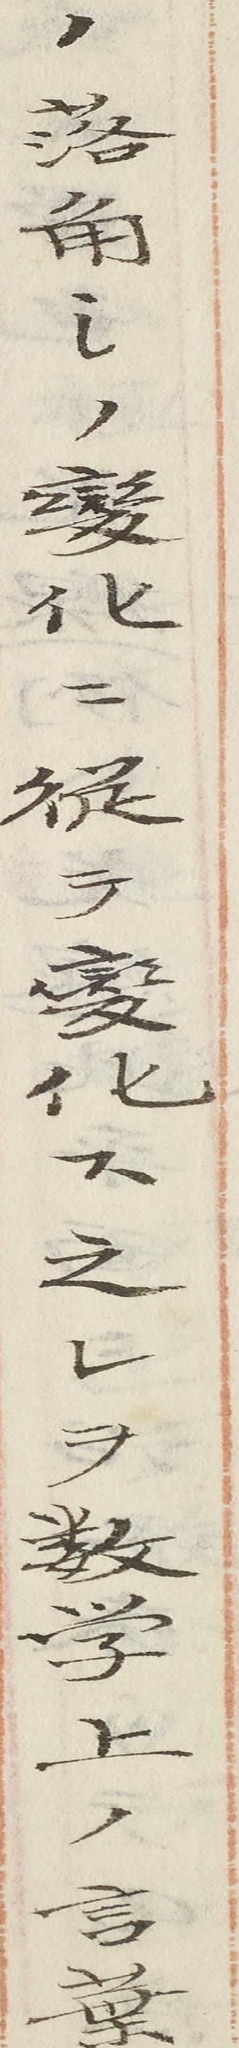ノ落角ｉノ変化ニ従テ変化ス之レヲ数学上ノ言葉
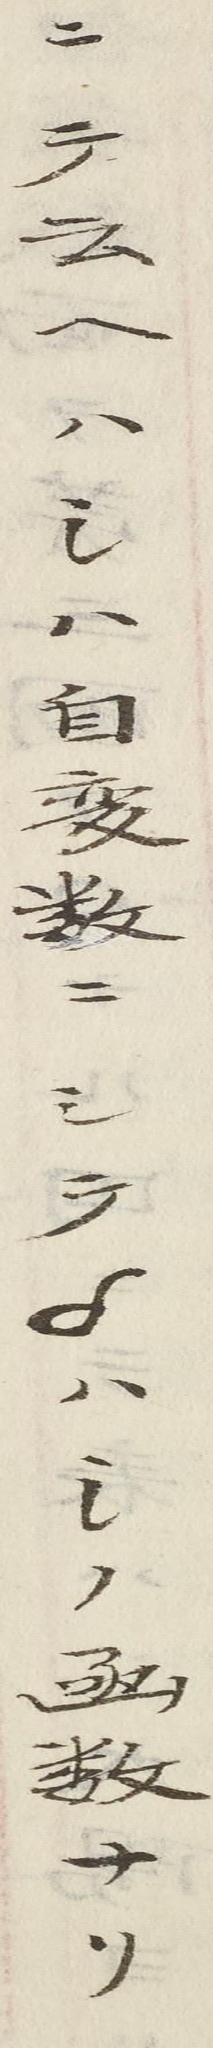ニテ云ヘハｉハ自変数ニシテｄハｉノ凾数ナリ
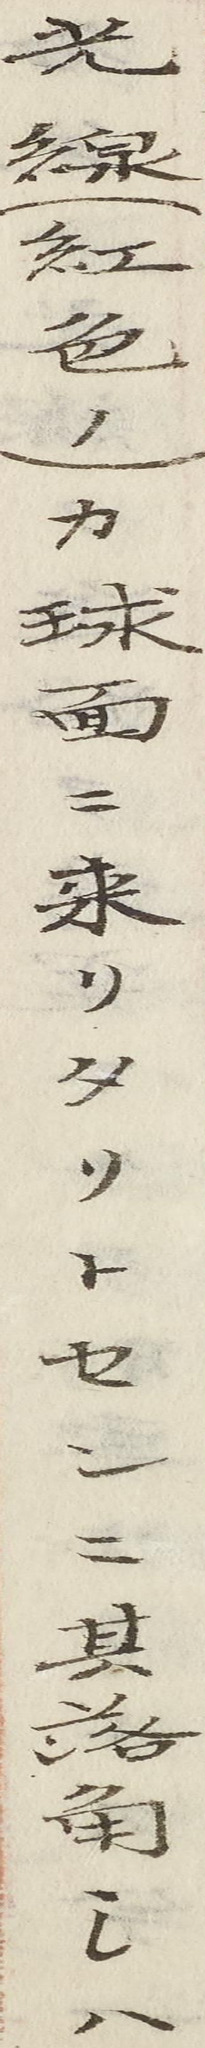光線カ球面ニ来リタリトセンニ其落角ｉハ
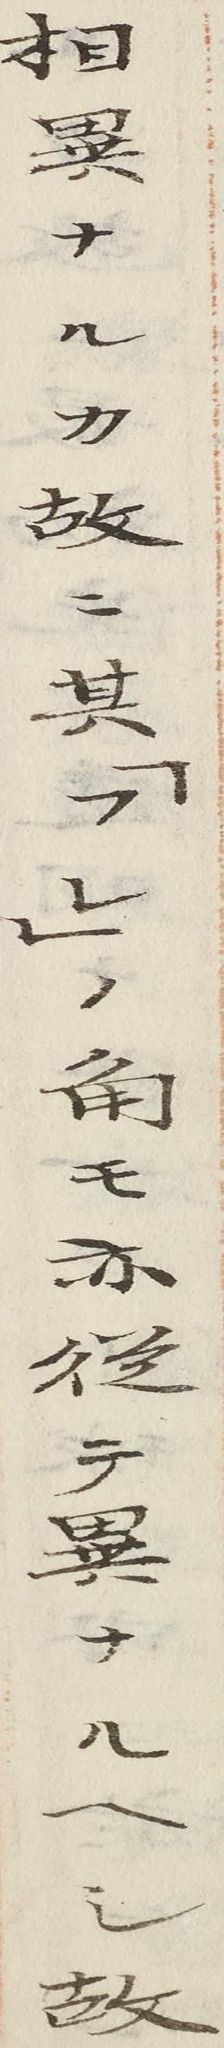相異ナルカ故ニ其「フレ」ノ角モ亦従テ異ナルヘシ故
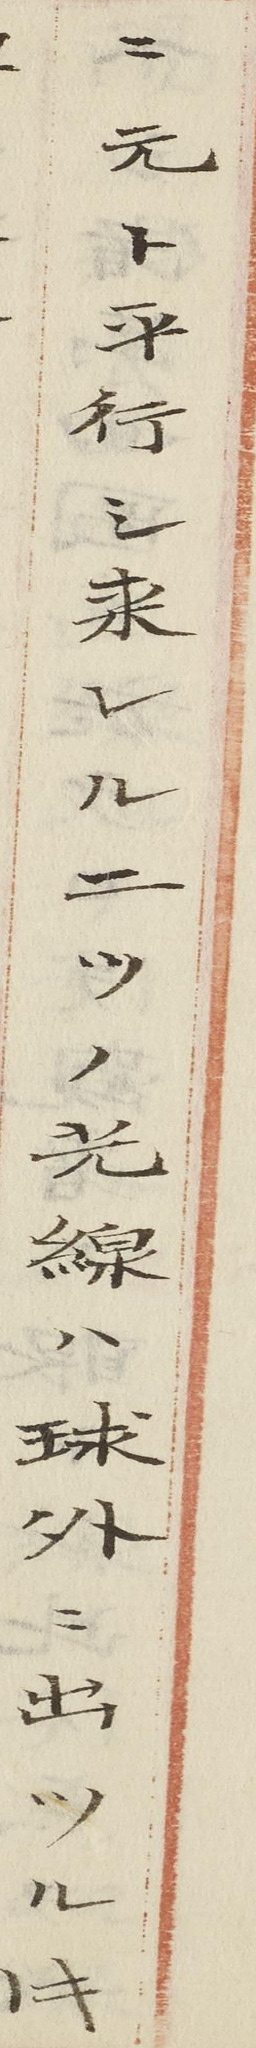ニ元ト平行シ来レル二ツノ光線ハ球外ニ出ツルトキ
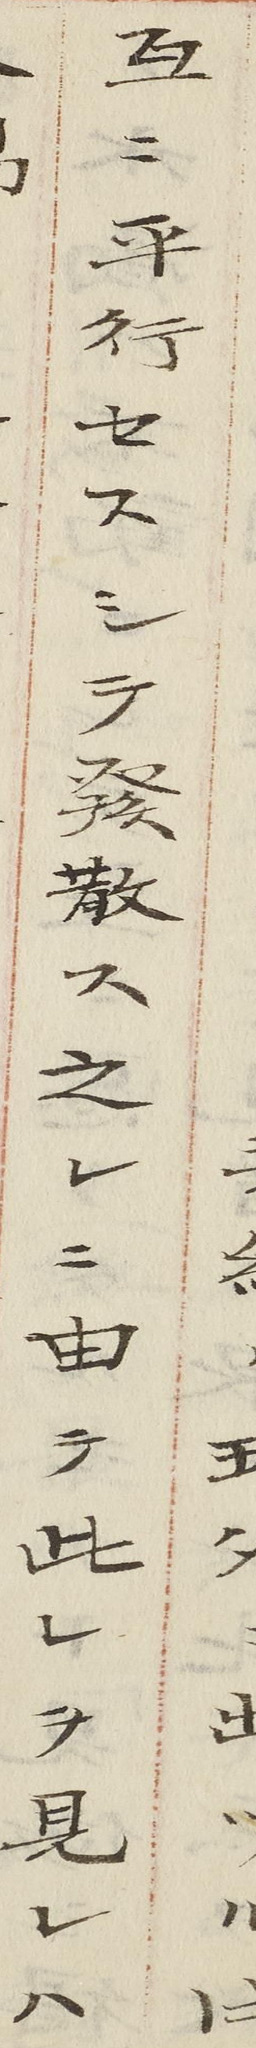互ニ平行セスシテ発散ス之レニ由テ此レヲ見レハ
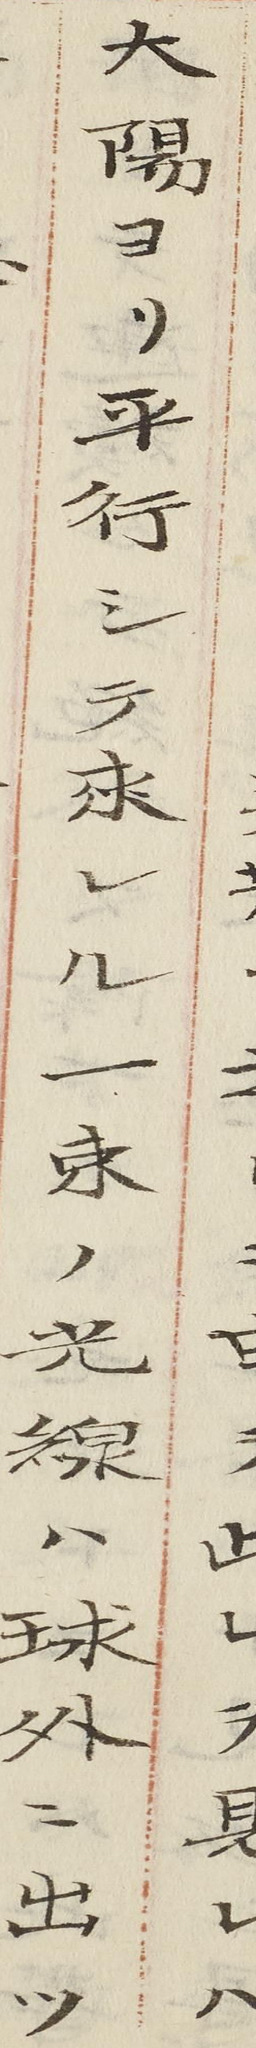大陽ヨリ平行シテ来レル一束ノ光線ハ球外ニ出ツ
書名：虹及ハロノ説明
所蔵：東京大学地震研究所図書室 Earthquake Research Institute Library, The University of Tokyo, JAPAN
